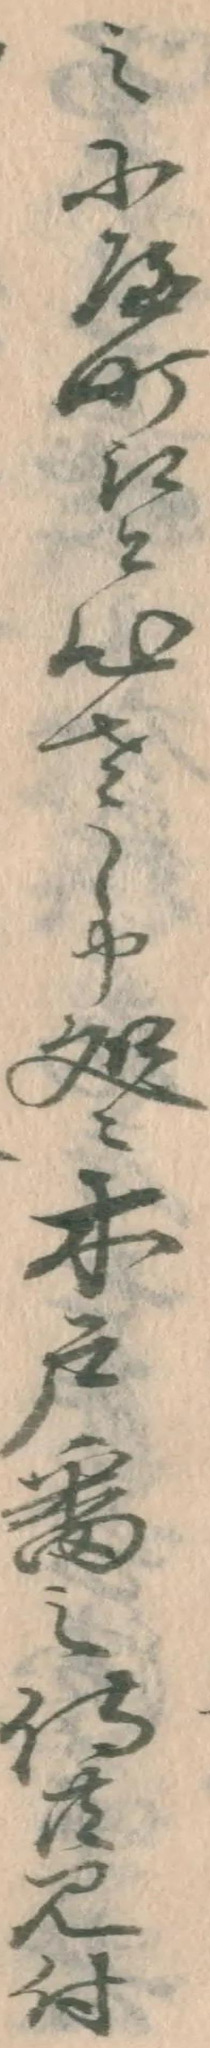之小屋町江と心さし申処に木戸番之侍共見付
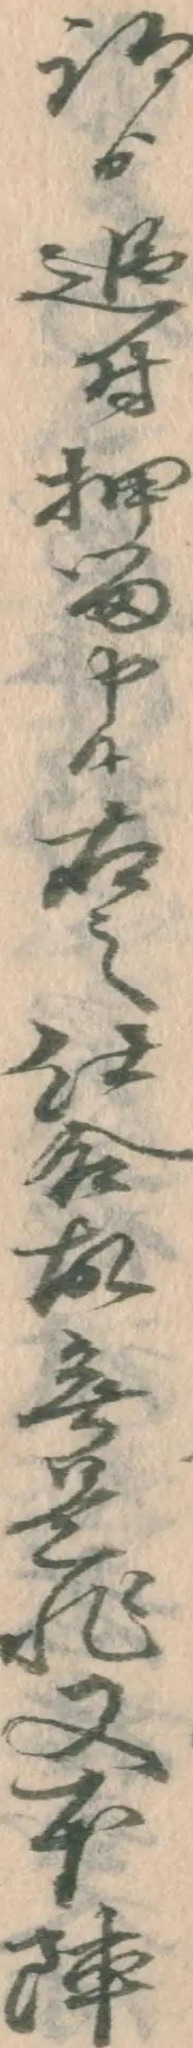跡ゟ追付押留申候右之仕合故無是非又本陣
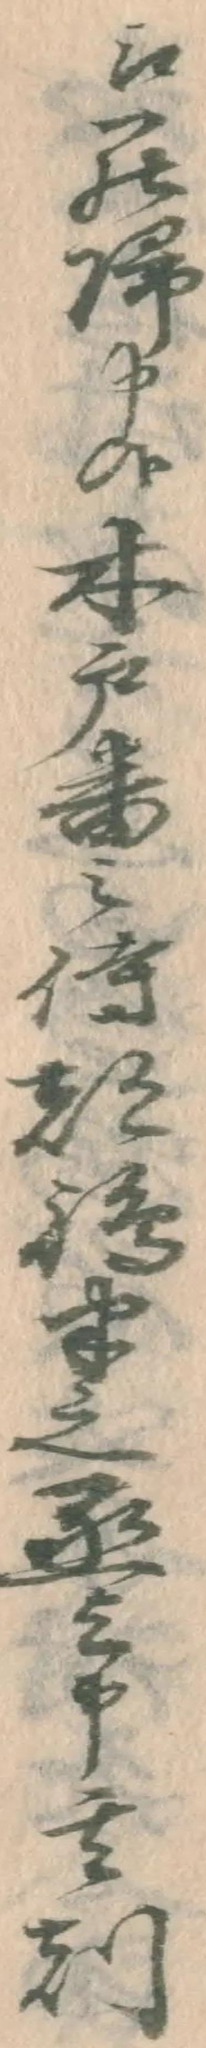江罷帰申候木戸番之侍都島半之丞与申其刻
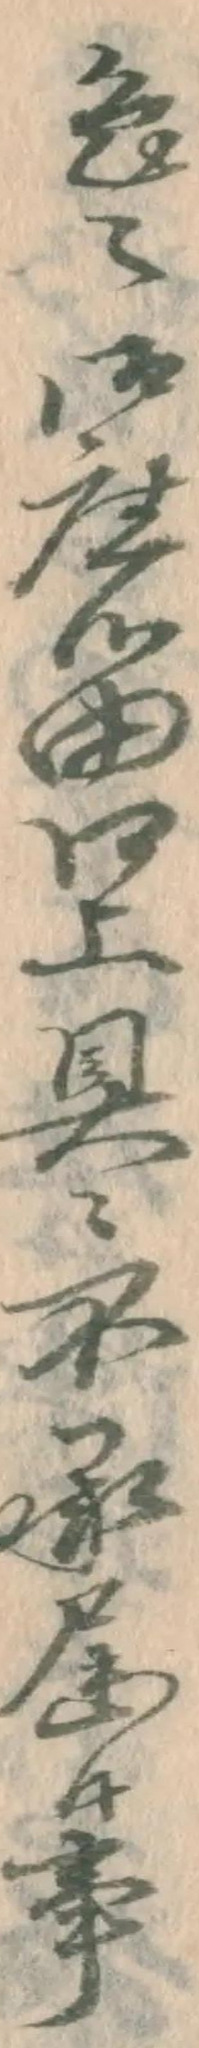急々御座候由口上具に不承届候事
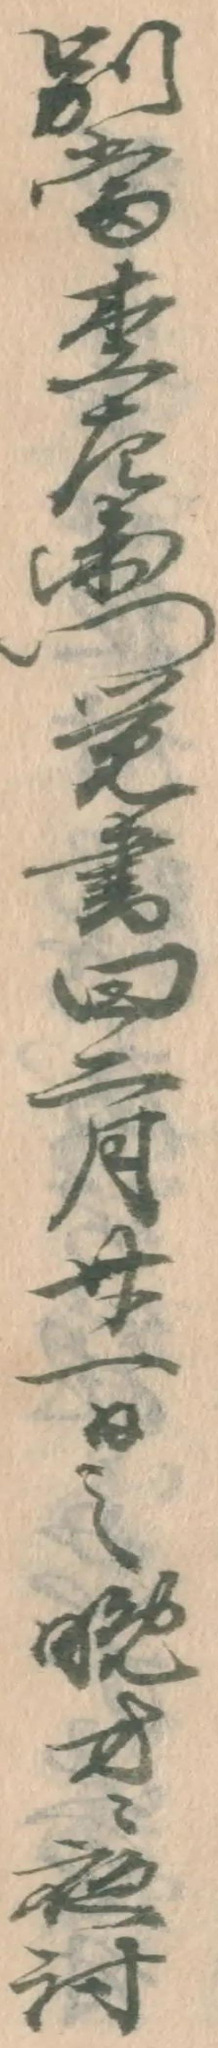別当杢左衛門覚書曰二月廿一日之晩方に夜討

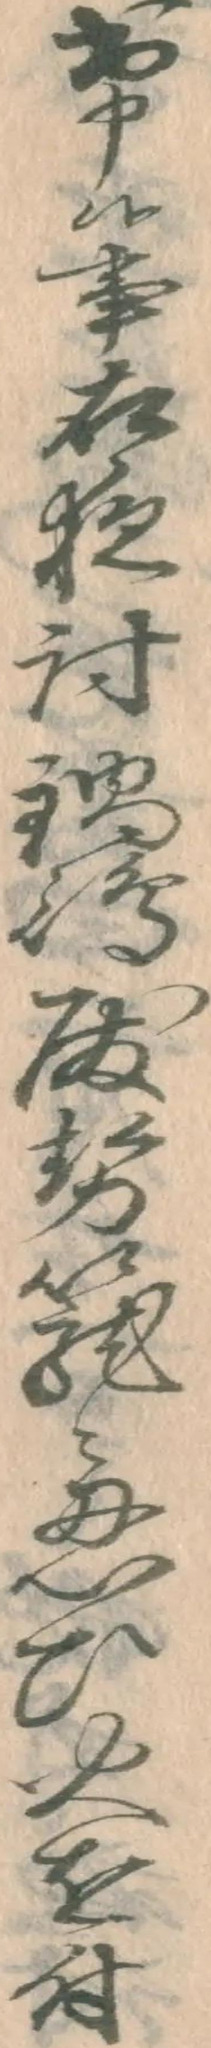出申候事右夜討鍋島殿勢籠に忍ひ火を付
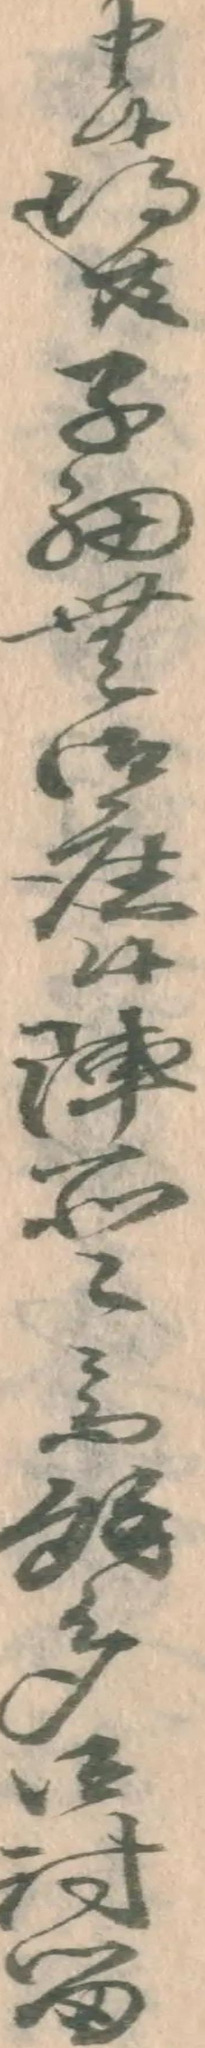申候得共子細無御座候陣所々に而余多御討留
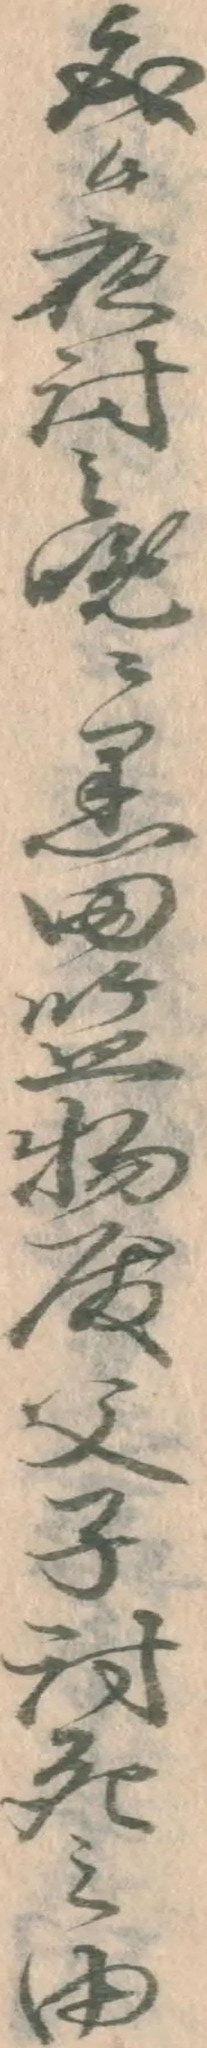被成候夜討之晩に黒田監物殿父子討死之由
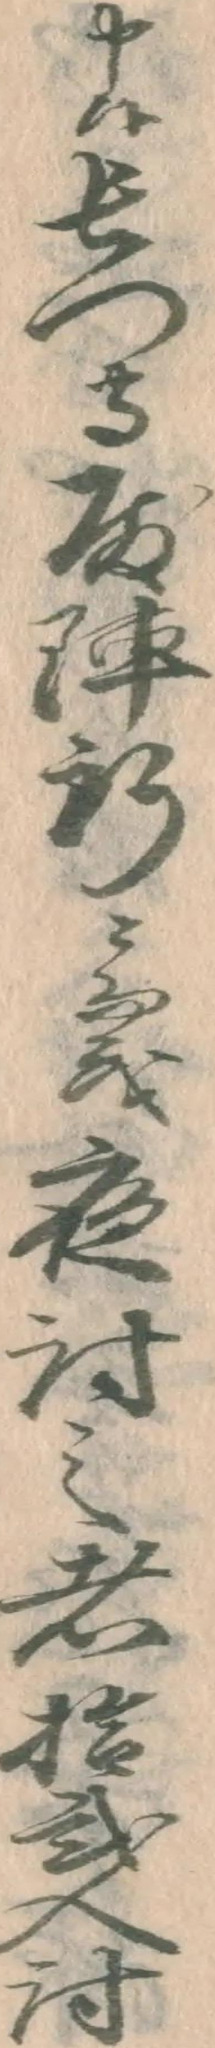申候長門守殿陣新に而茂夜討之者拾弐人討
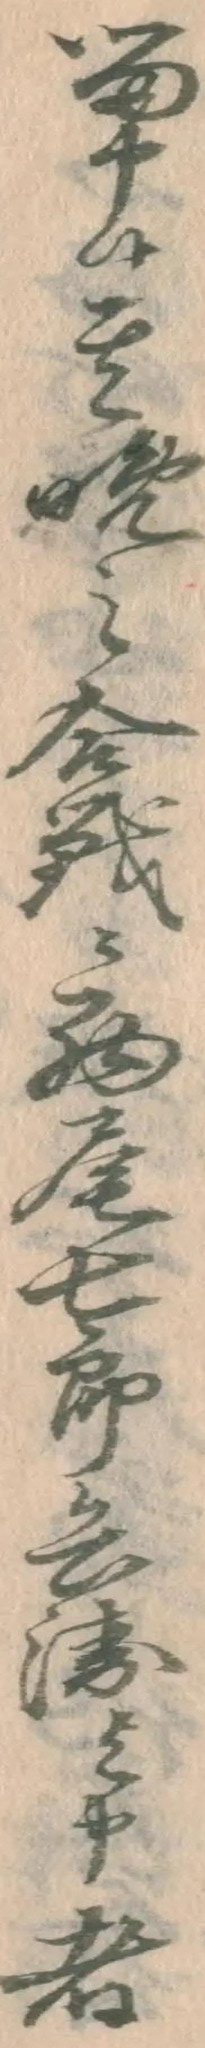留申候其晩之合戦に西尾七郎兵衛与申者
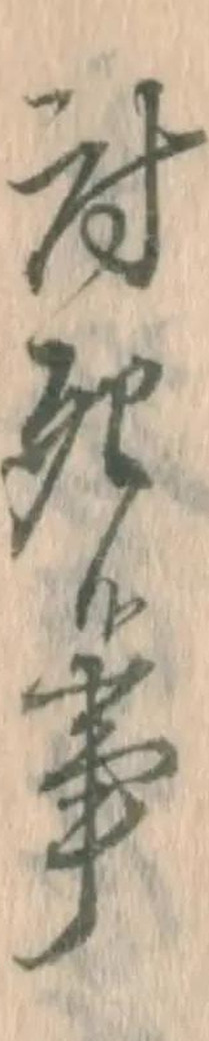討死候事
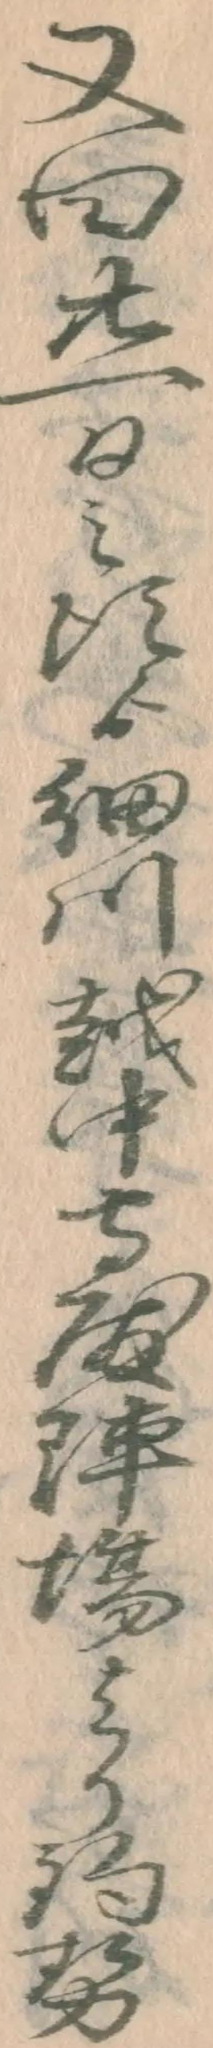又曰廿一日之頃ゟ細川越中守殿陣場与り釣勢
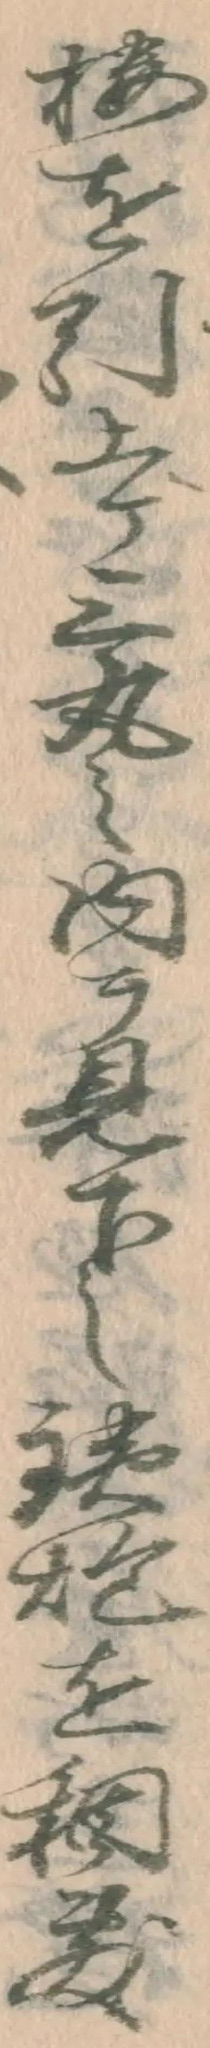樓を引上け三丸之内を見下し鉄炮を稠敷
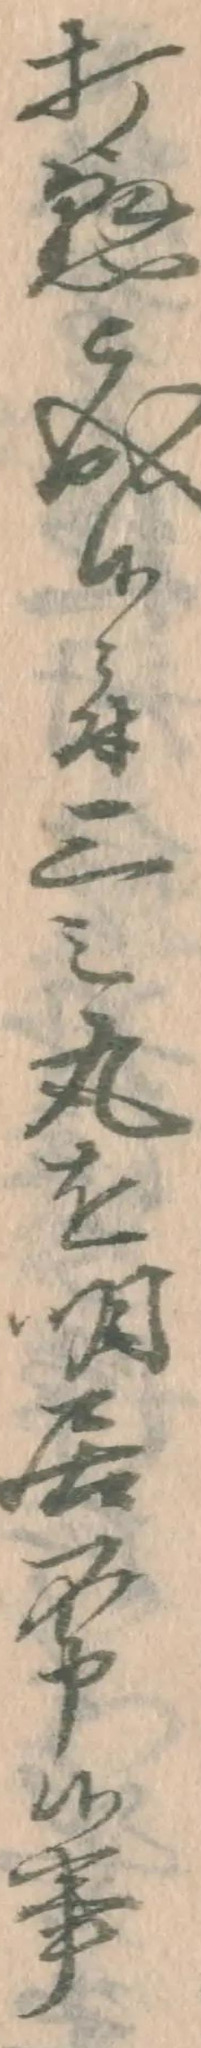打懸被成候に付三之丸を明居不申候事
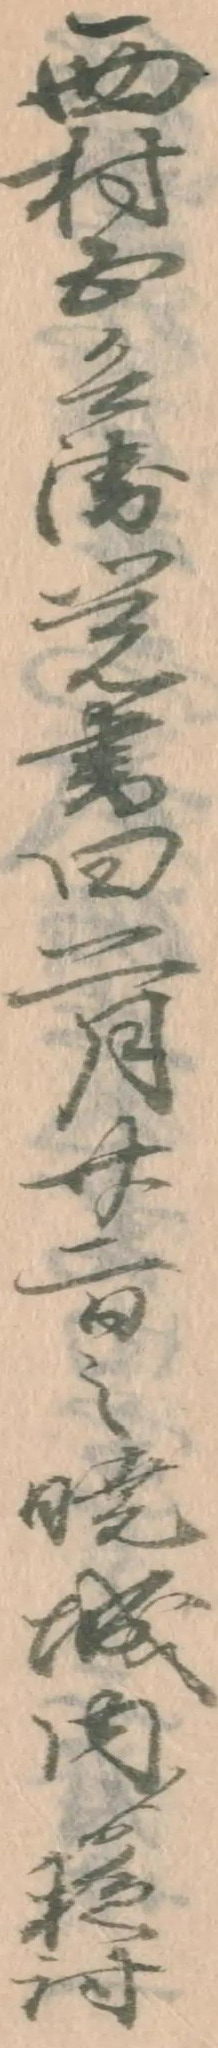西村五兵衛覚書曰二月廿二日之暁城内ゟ夜討
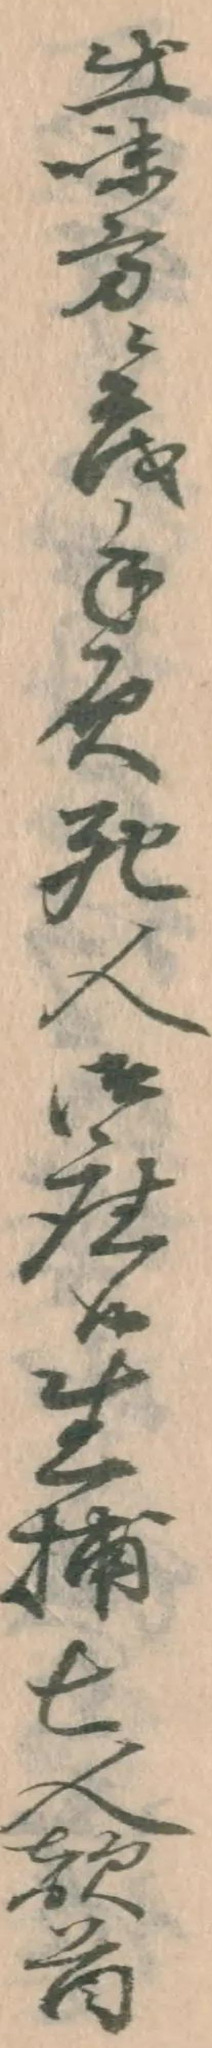出味方に茂手負死人御座候生捕七人敵首
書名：切支丹御退治記 49巻. [7]
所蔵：国立国会図書館 National Diet Library, JAPAN
